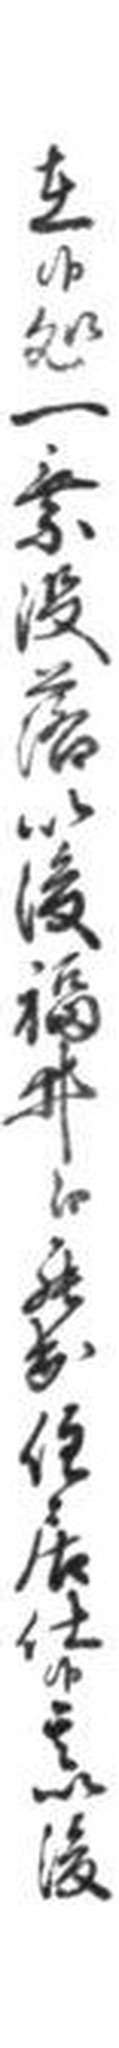在候処一乗没落以後福井江罷出住居仕候其以後
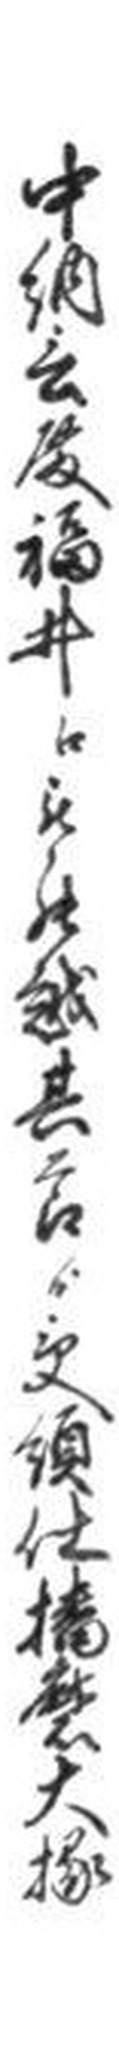中納言殿福井江被罷越其節ゟ受領仕播磨大掾
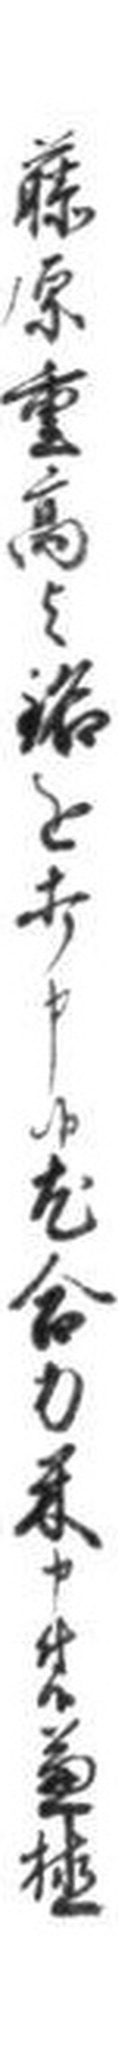藤原重高与銘を打申候尤合力米申付候兼植
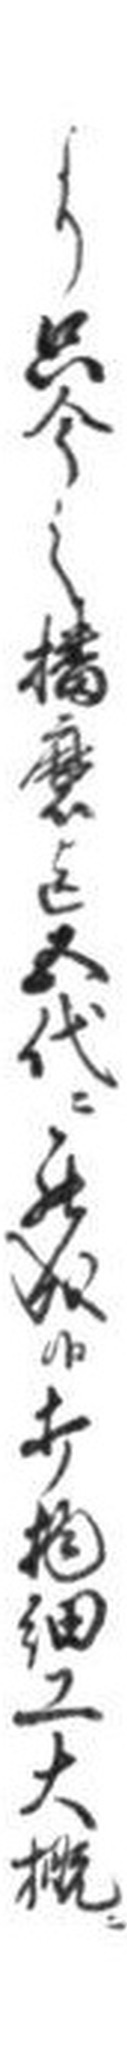より只今之播磨迄五代ニ罷成候打物細工大概ニ
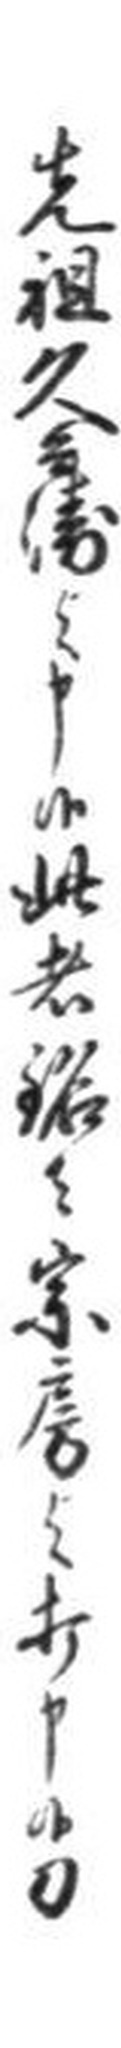一先祖久兵衛与申候此者銘者宗房与打申候刀
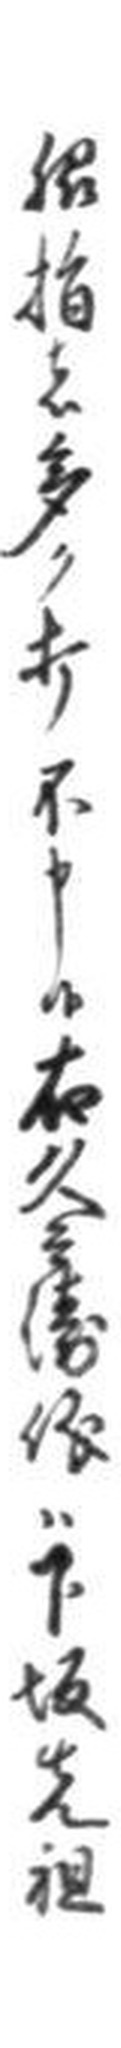脇指者多ク打不申候右久兵衛儀ハ下坂先祖
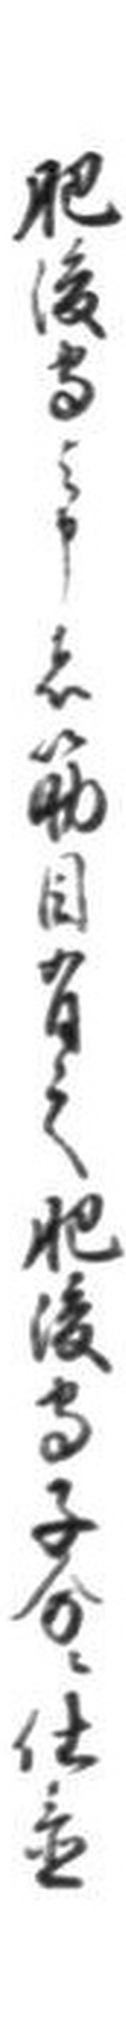肥後守与申者筋目有之肥後守子分ニ仕置
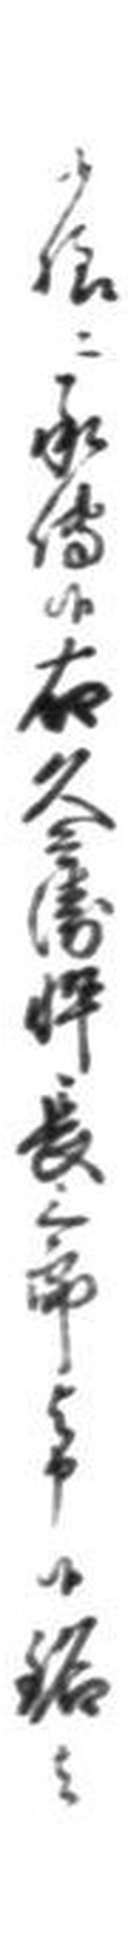候様ニ承伝候右久兵衛忰長三郎与申候銘者
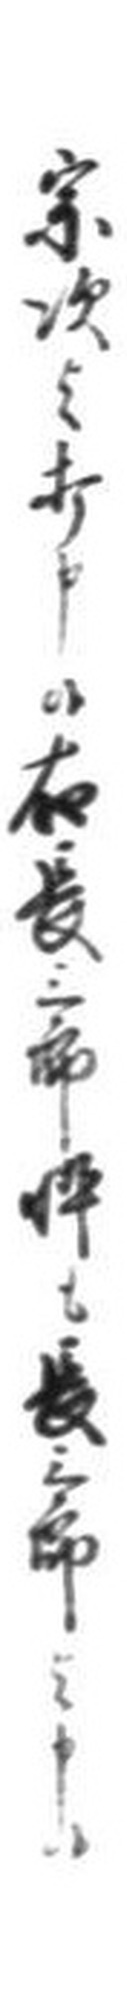宗次与打申候右長三郎忰も長三郎与申候
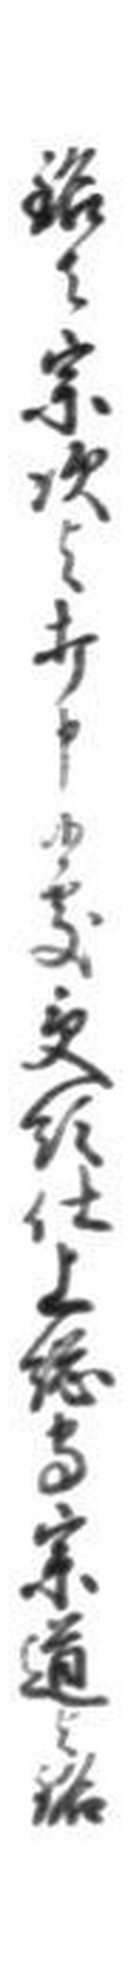銘者宗次与打申候処受領仕上総守宗道与銘
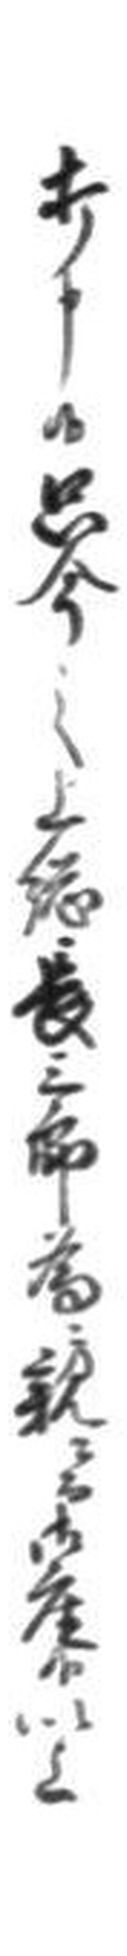打申候只今之上総長三郎為親ニ而御座候以上
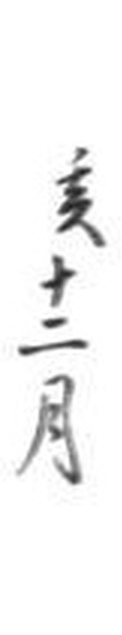亥十二月
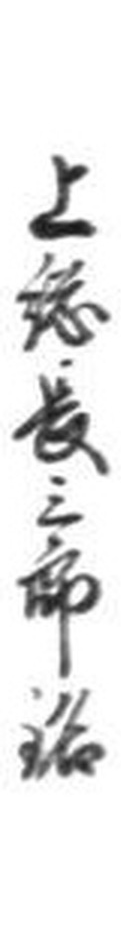上総長三郎銘
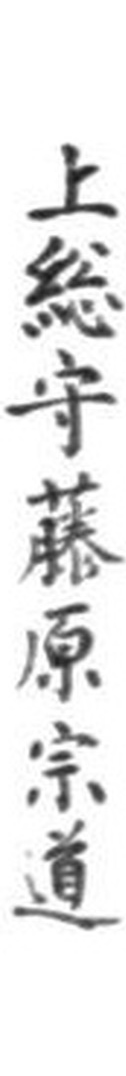上総守藤原宗道
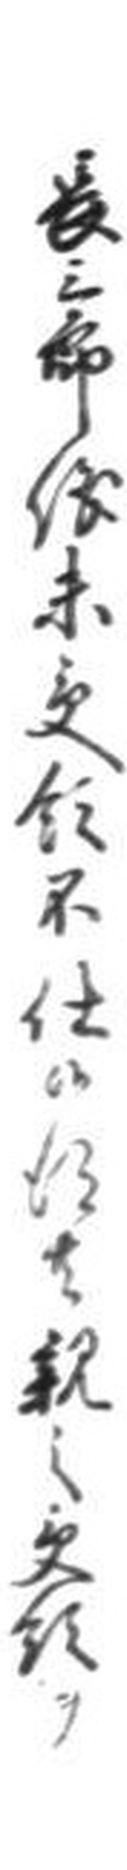長三郎儀未受領不仕候得共親之受領ヲ

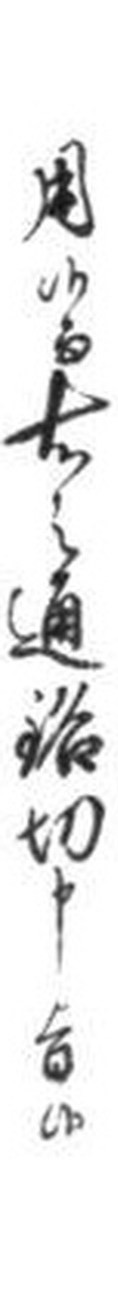用候而右之通銘切申旨候
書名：家譜 三十三 吉邦公 享保四年
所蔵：福井県文書館 Fukui Prefectural Archives
